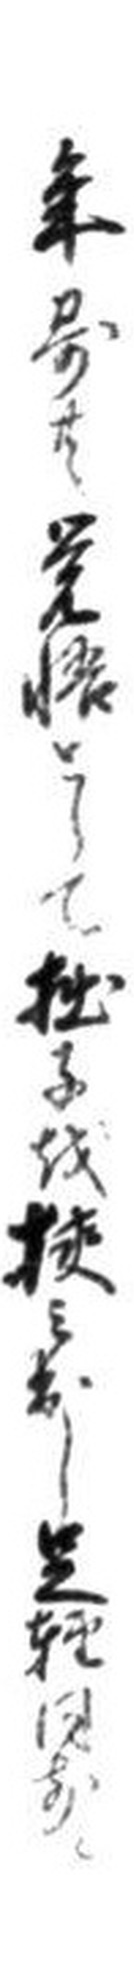年寄共覚悟として拙子を挟み出し足軽同前ニ
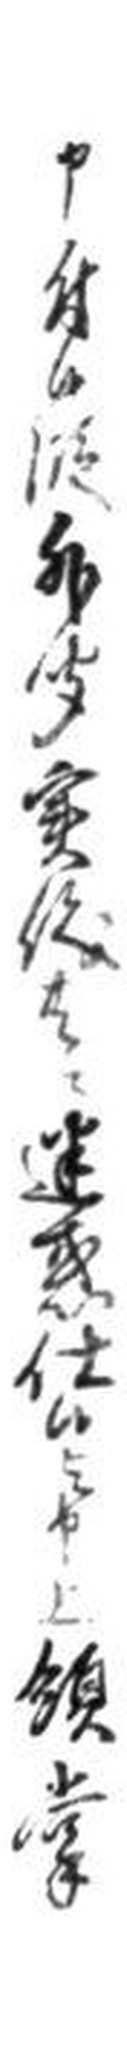申付候段外聞実儀共ニ迷惑仕候与申上領掌
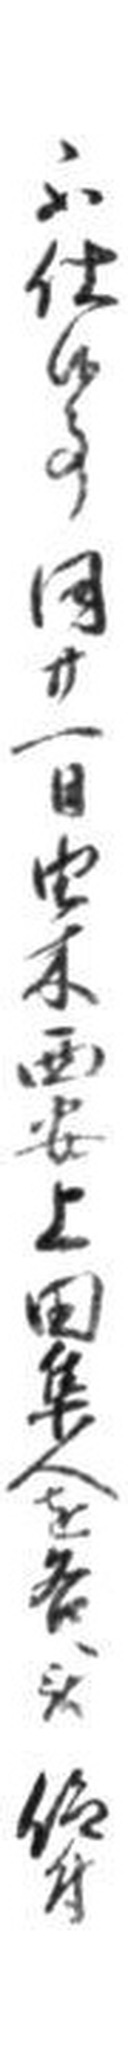不仕候事同廿一日由木西安上田隼人を各へ被仰付
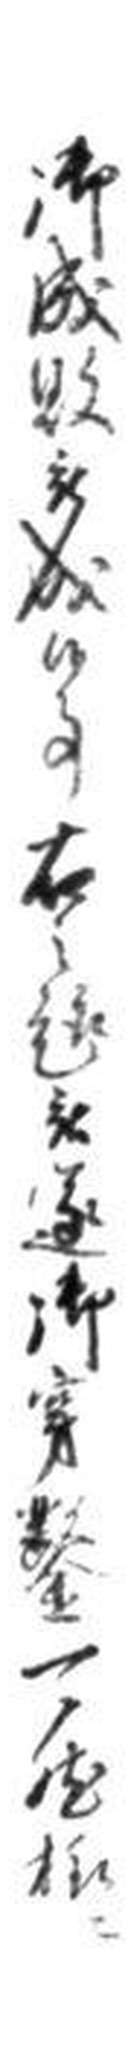御成敗被成候事右之趣被遂御穿鑿可然様ニ
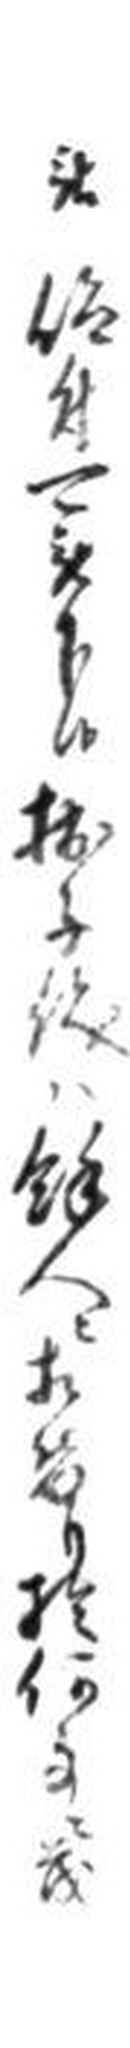被仰付可被下候拙子儀ハ余人ニ相替り於何事ニ茂
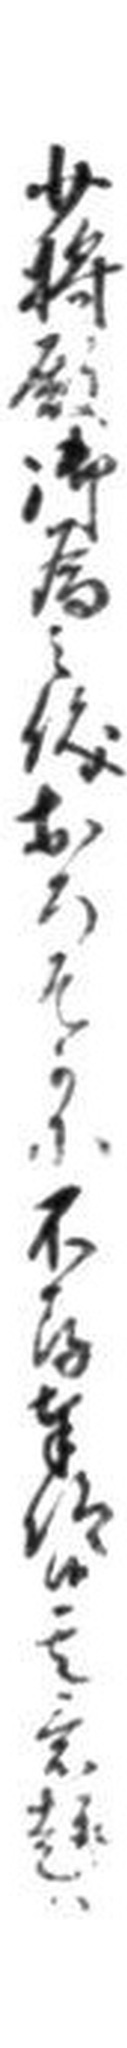少将殿御為之儀おろそかに不存奉仰候其意趣ハ
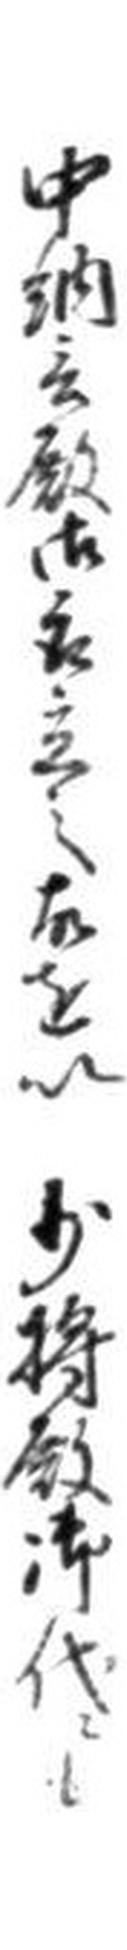中納言殿御取立之故を以少将殿御代ニも
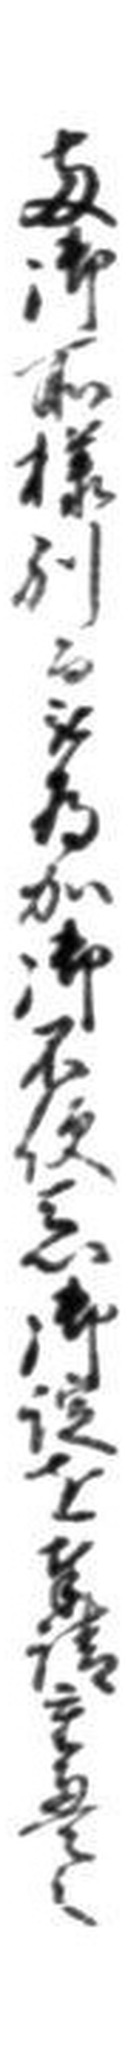両御所様別而被為加御不便御諚を奉請重畳之
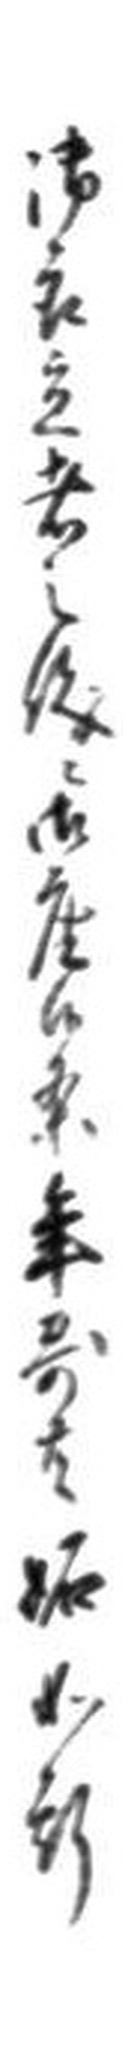御取立者之儀ニ御座候条年寄共妬如斯
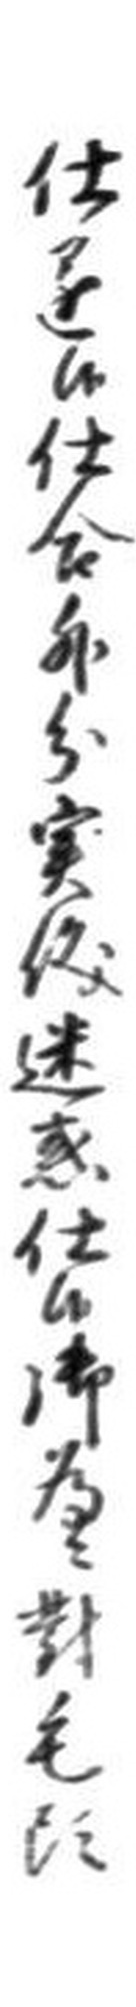仕懸候仕合外分実儀迷惑仕候御為ニ対毛頭
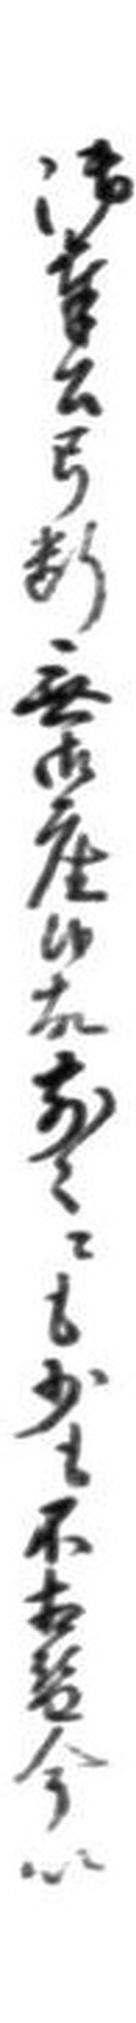御奉公弓断無御座候故前々ニも少も不相替今以
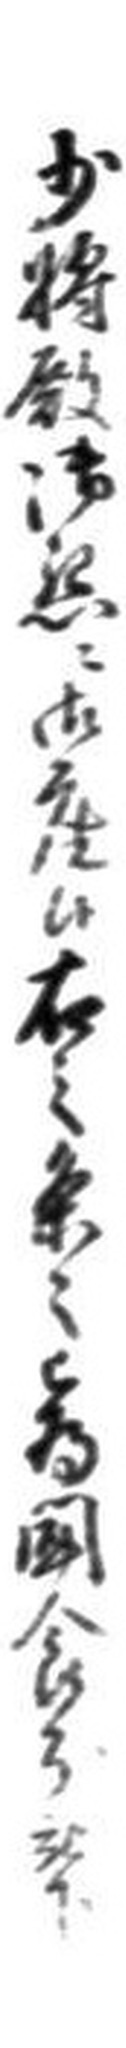少将殿御懇ニ御座候右之条々被為聞食分被下
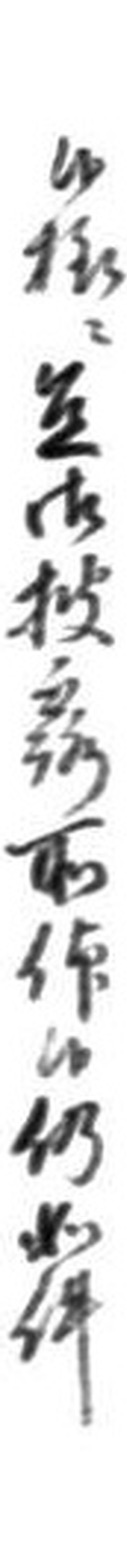候様ニ宜御披露所仰候仍如件
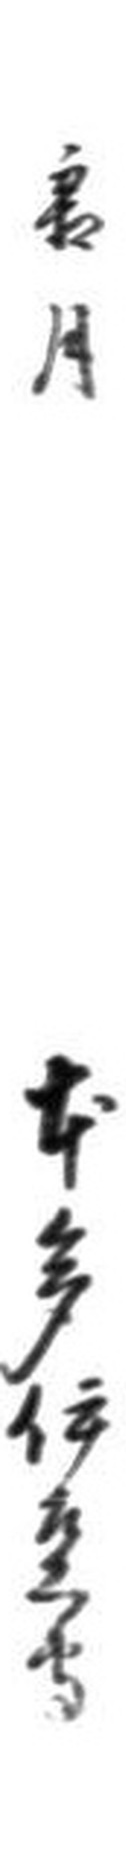霜月本多伊豆守
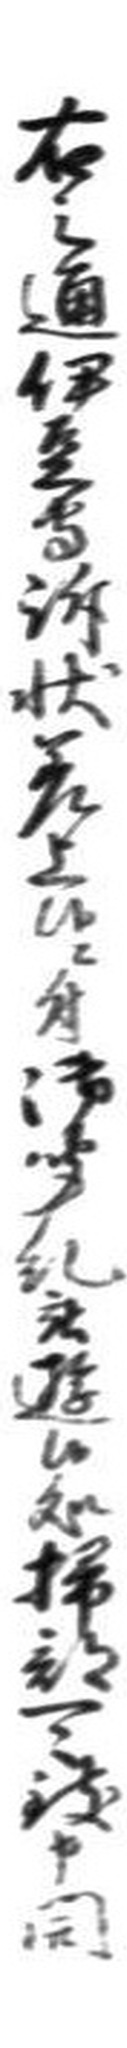右之通伊豆守訴状差上候ニ付御聞糺被遊候処掃部可致申開
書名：家譜 二 忠直公 従文禄四年到慶安四年
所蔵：福井県文書館 Fukui Prefectural Archives
